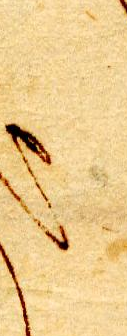To
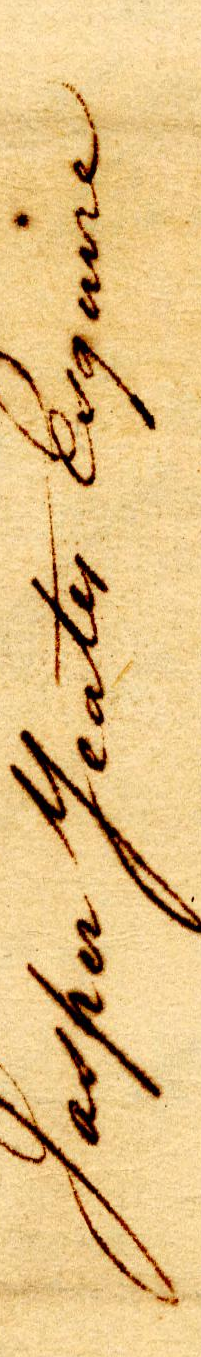Jasper Yeates Esquire
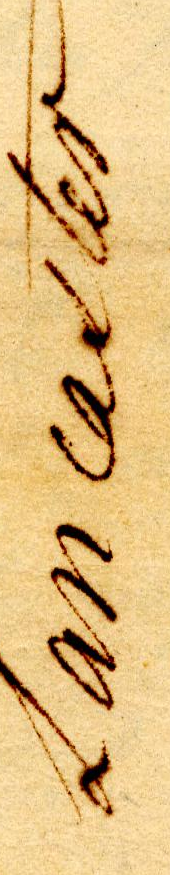Lancaster
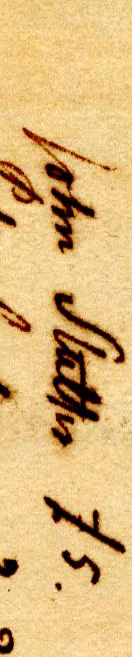John Slatter £5
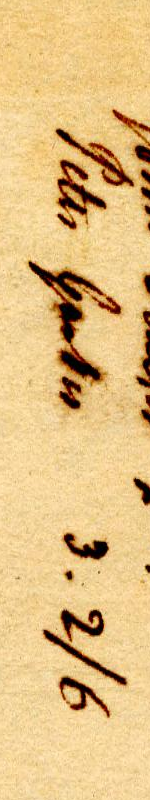Peter Gordes 3. 2s6
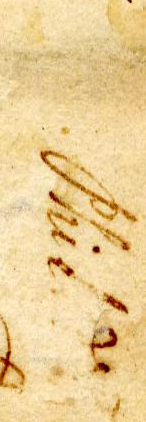Phil^a
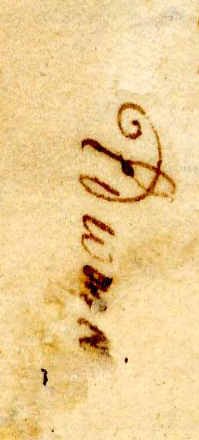Edward
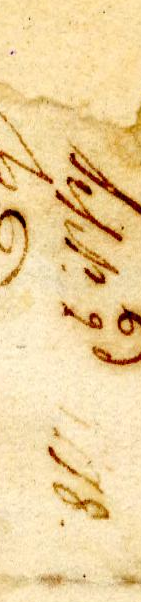Sept^r. 2^d 1778
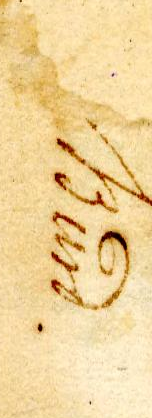Burd
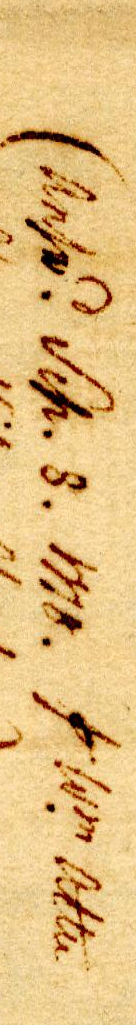(Answ^d. Sep. 8. 1778. per W^m. Atter
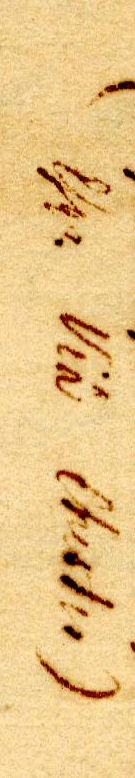Esq^r. Via Chester)
